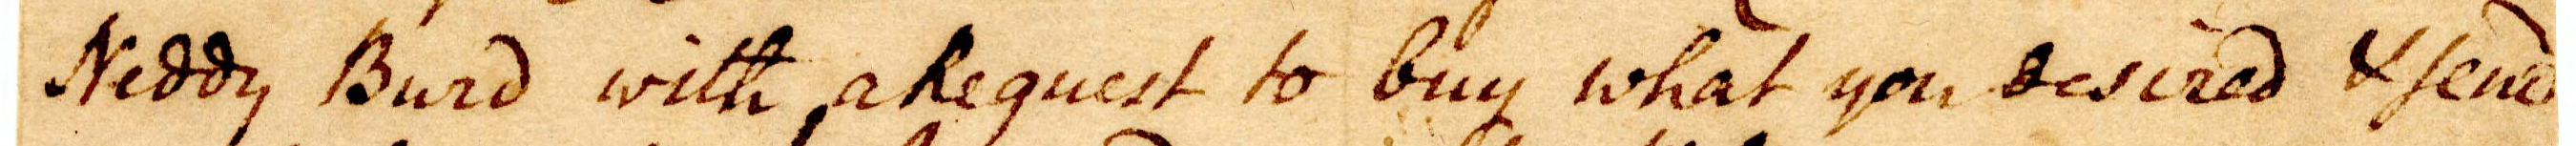Neddy Burd with a Request to buy what you desired & send
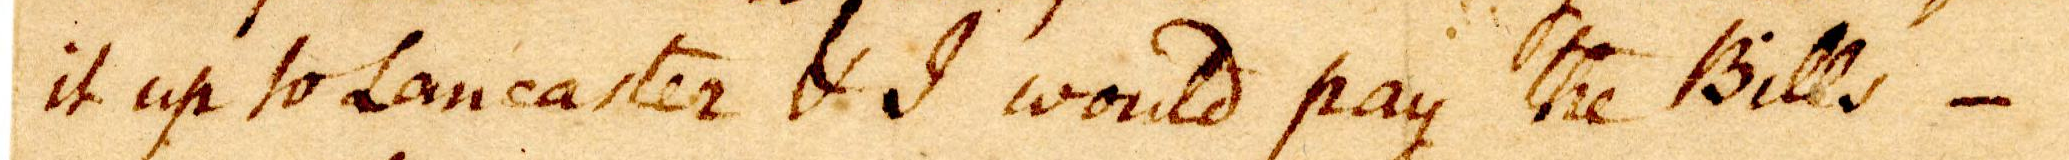it up to Lancaster & I would pay the Bills-
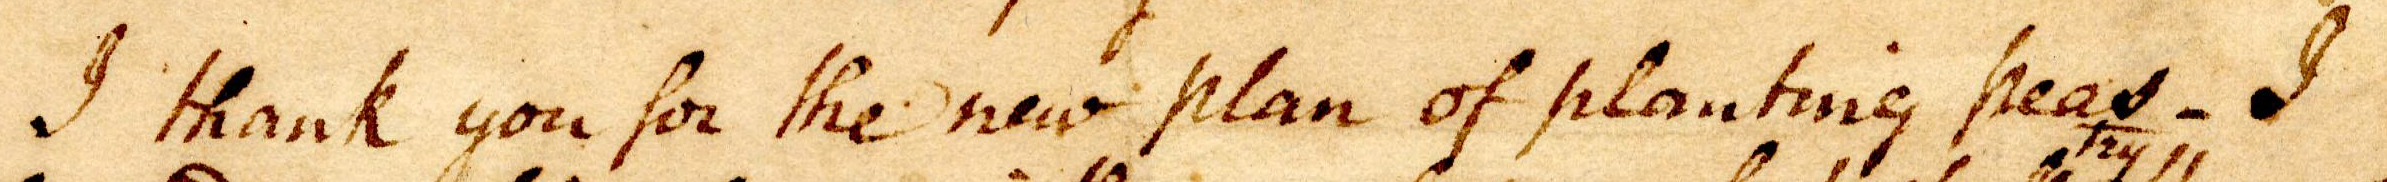I thank you for the new plan of planting peas- I
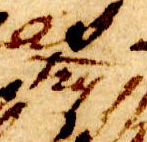try
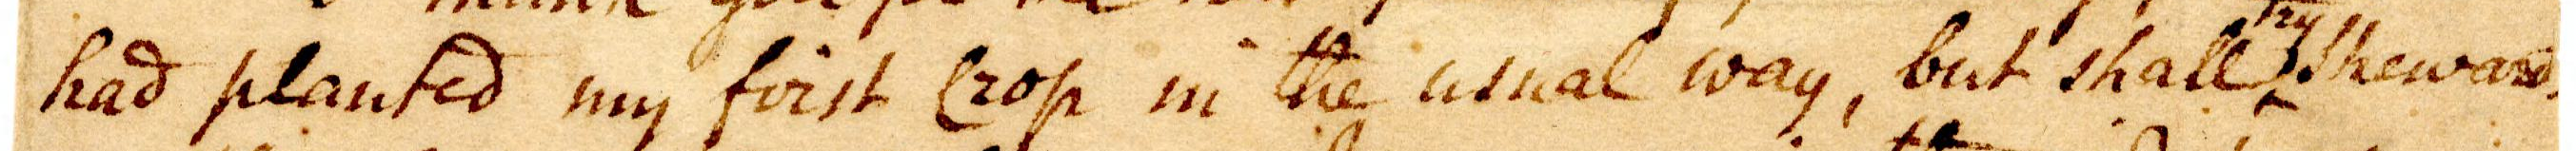had planted my first Crop in the usual way, but shall ^ the ward
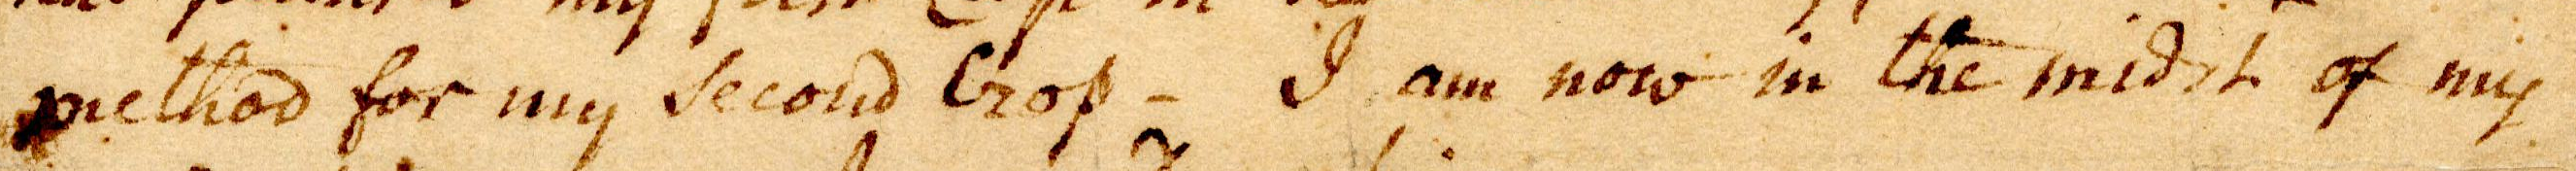method for my second Crop- I am now in the midst of my
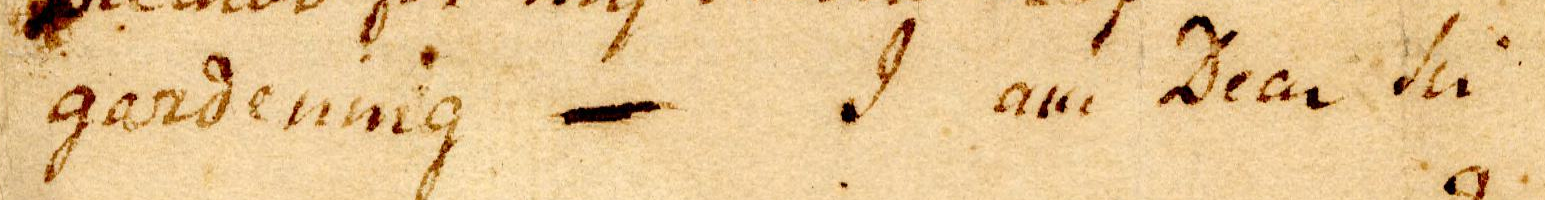gardening- I am Dear Sir
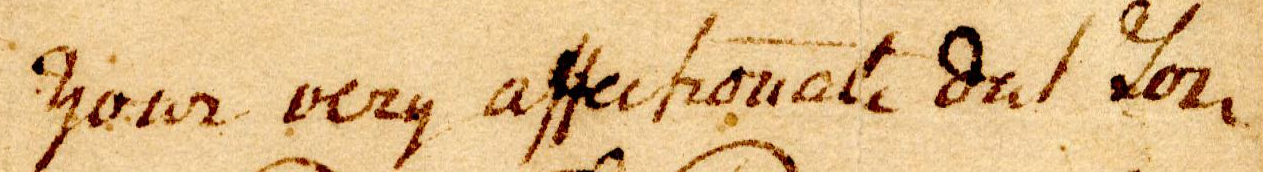Your very affectionate dut Son
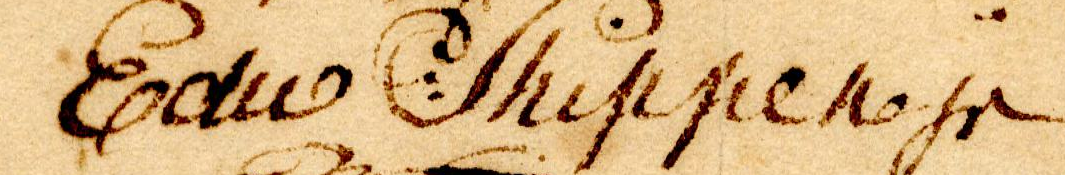Edw^d: Shippen jr
